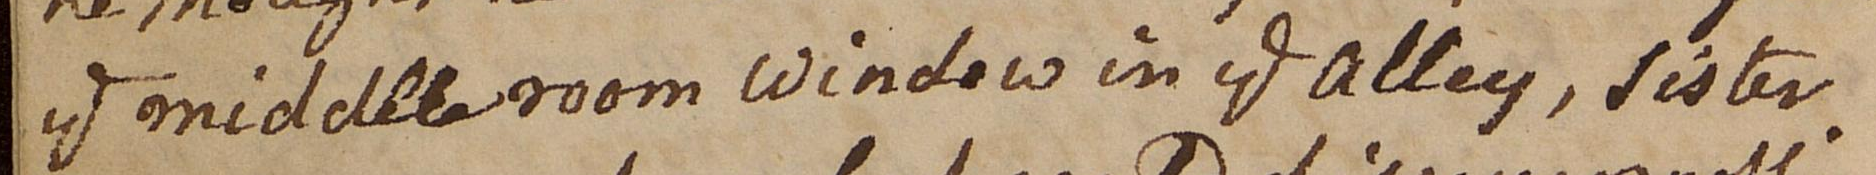y^e middele room window in y^e alley, Sister
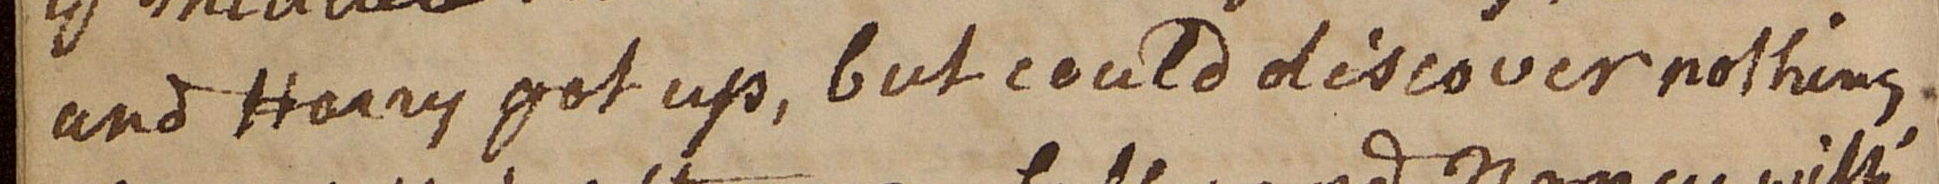and Henry got up, but could discover nothing,
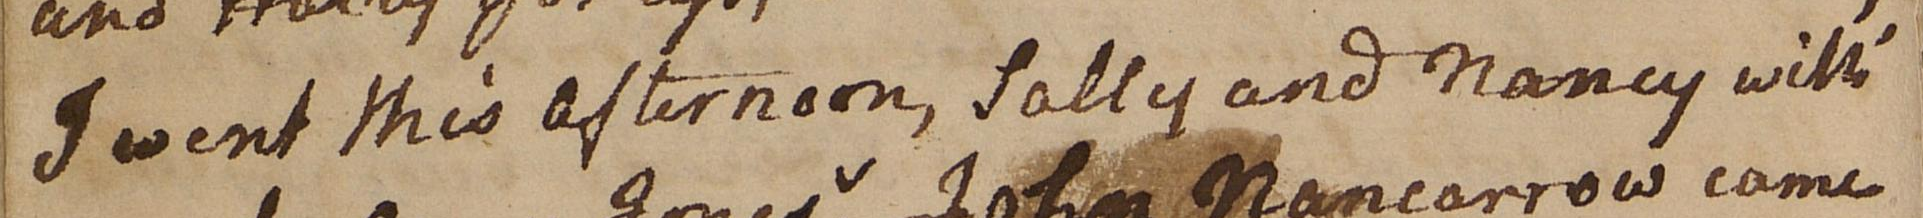I went this afternoon, Sally and Nancy with
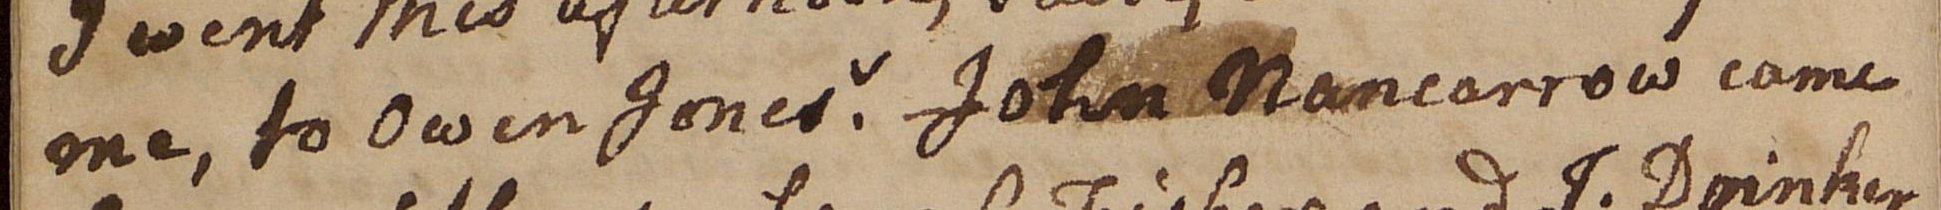me, to Owen Jones^s. John Nancarrow came
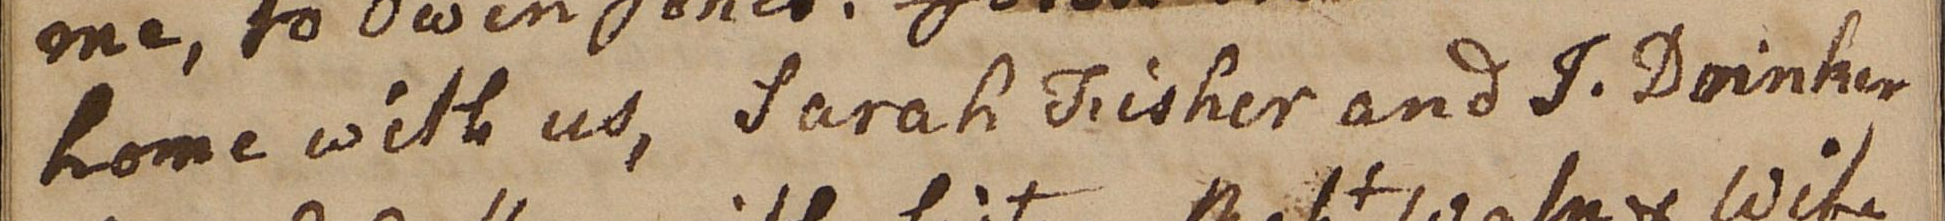home with us, Sarah Fisher and I. Drinker
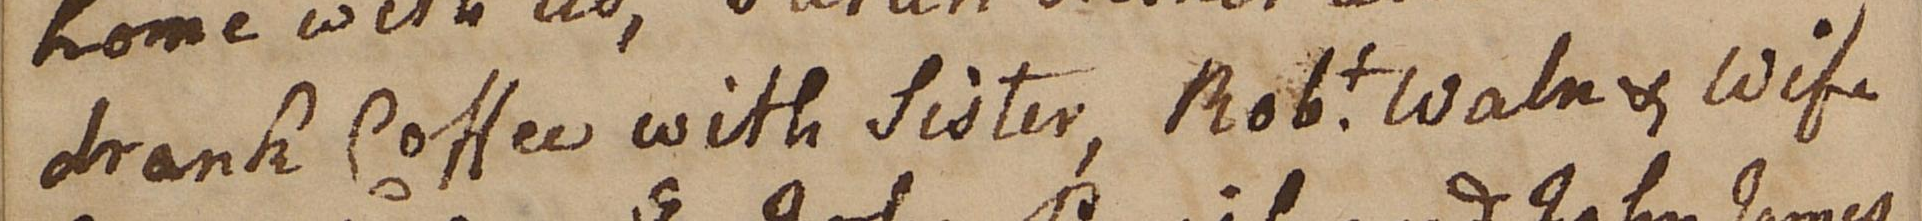drank Coffee with Sister, Rob^t. Waln & Wife
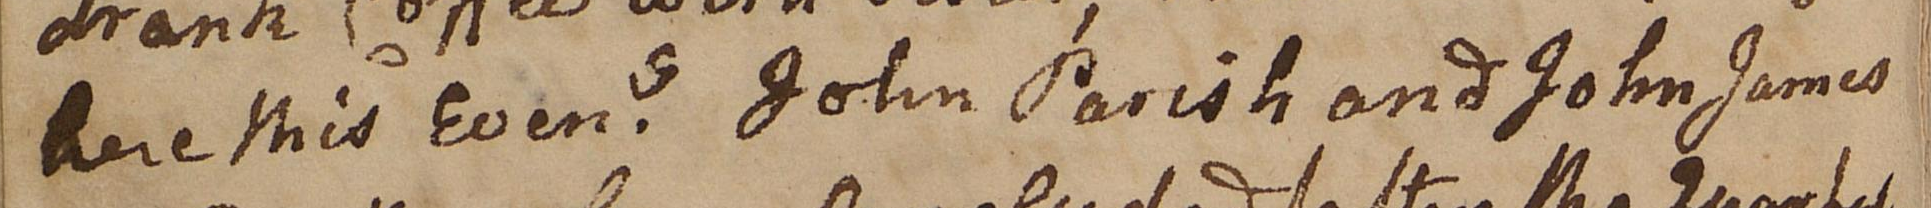here this Even^g. John Parish and John James
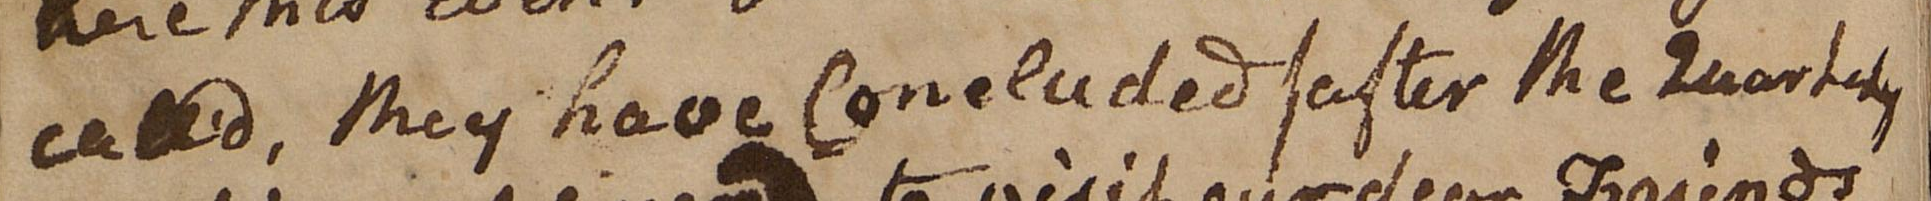call'd, they have Concluded faster the Quartely
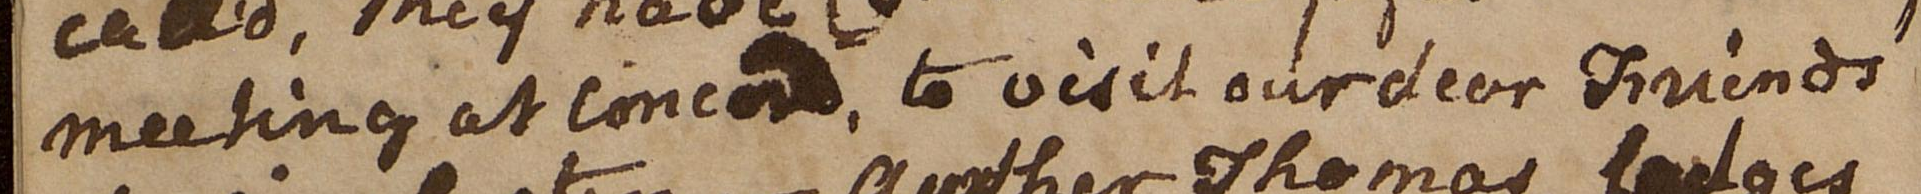meeting at Concord, to visit our dear Friends
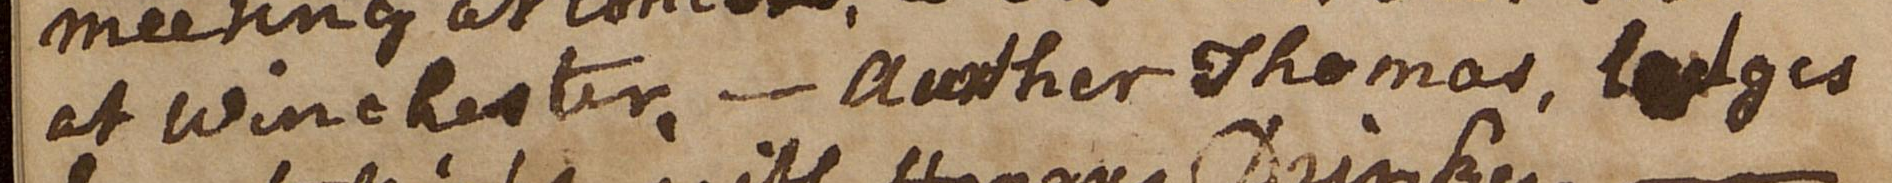at Winchester.- Aurther Thomas, lodges
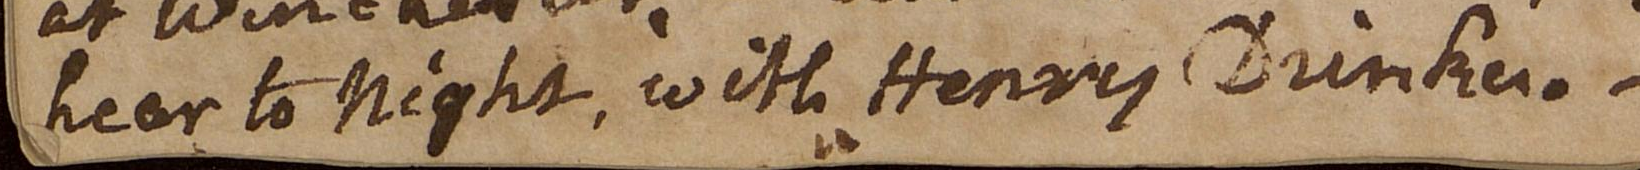hear to night, with Henry Drinker. -
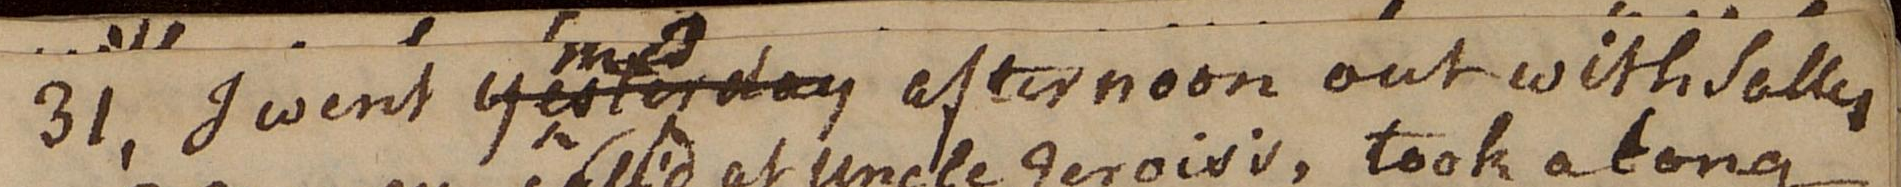31, I went [yesterday] ^ afternoon out with Sally
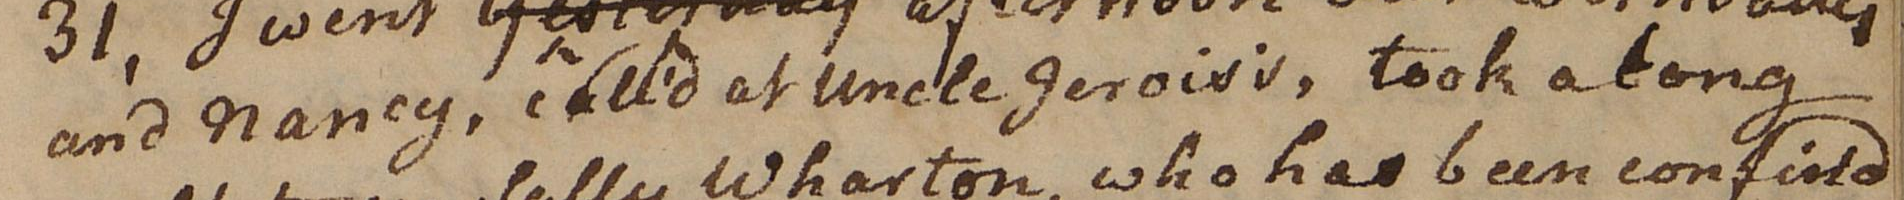and Nancy, call'd at Uncle Jervis's, took a long
